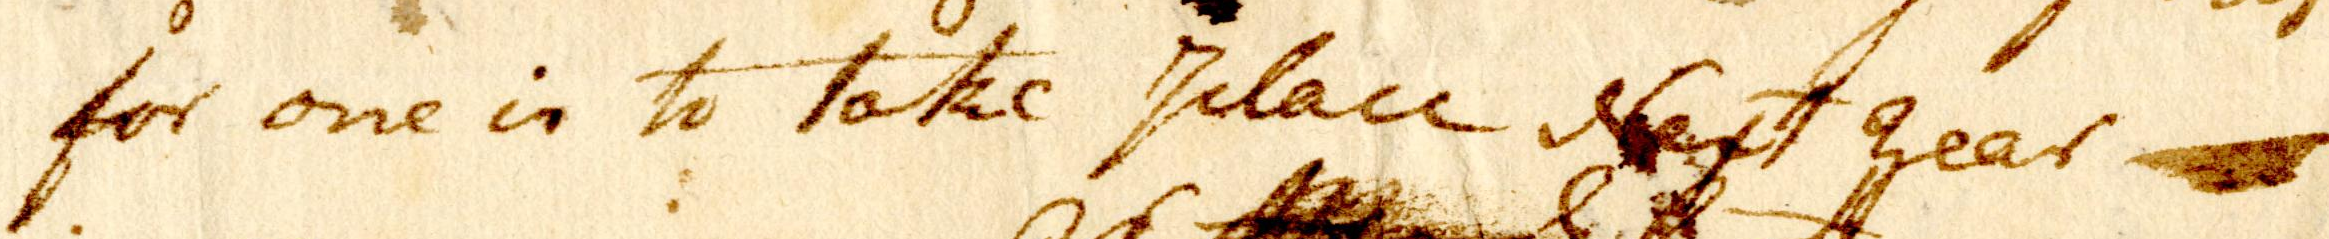for one is to take place Next year-
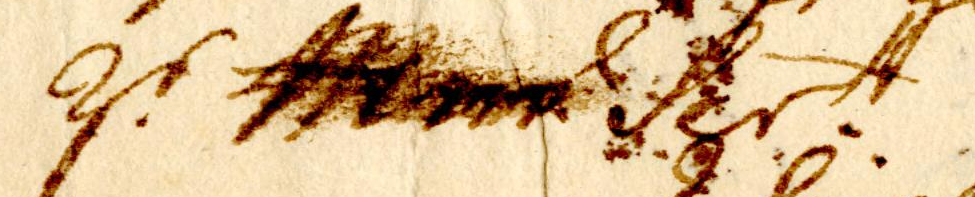y^r. [___]^l Ser^t.
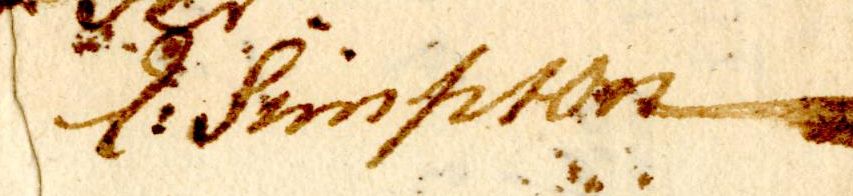E: Simpros
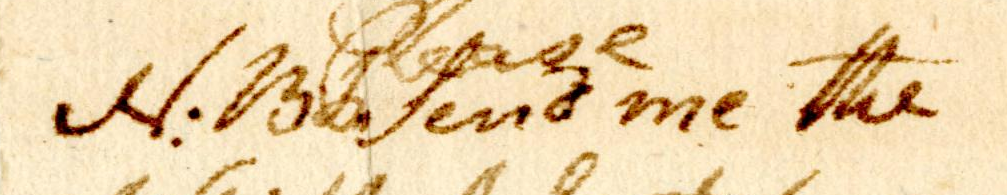N:B Send me the
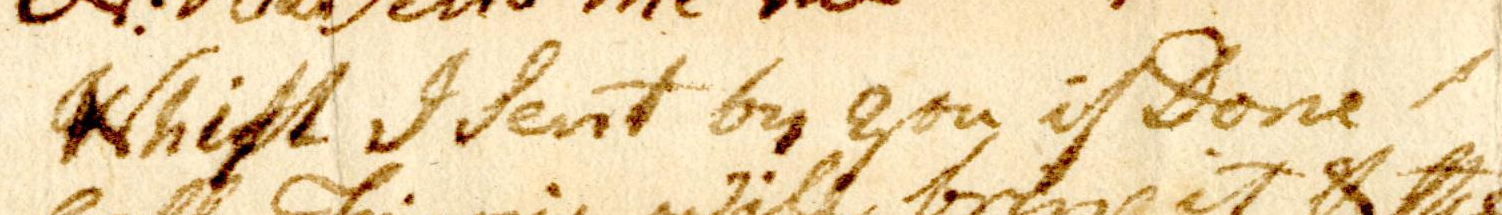Whipt I Sent by you if Done
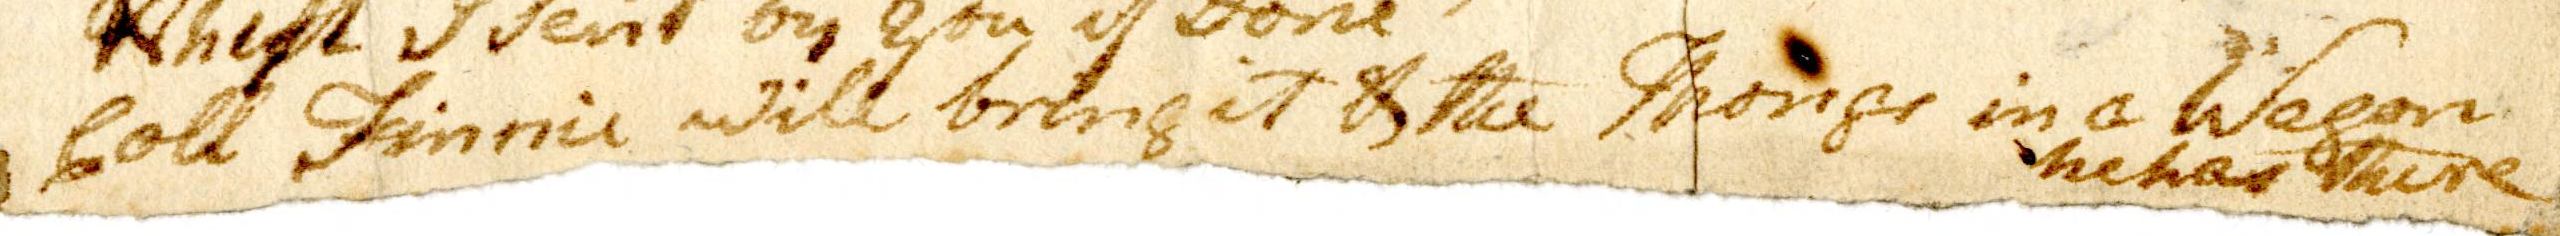Coll Finnie will bring it & the Thongs in a Wagon
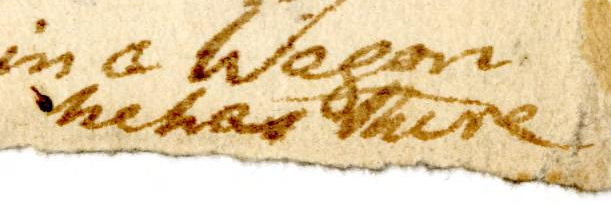nehas there
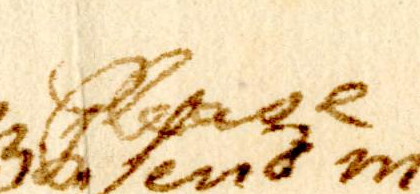Please
